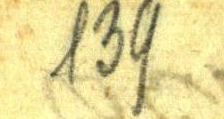139
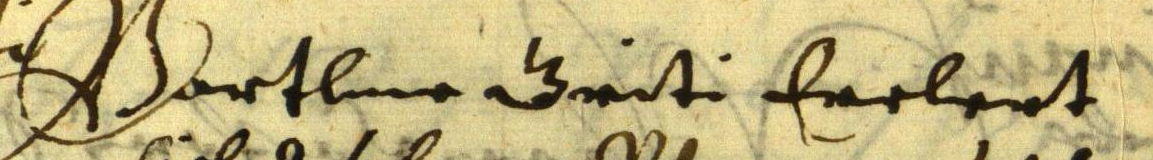Bartlme Griti Erclert
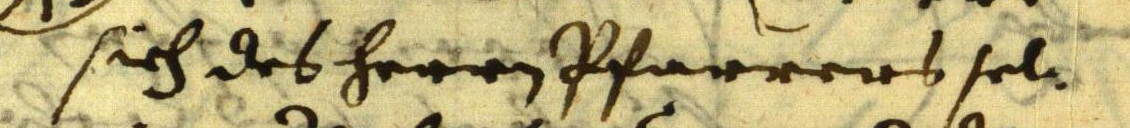sich des herrn Pfarrers sel¬
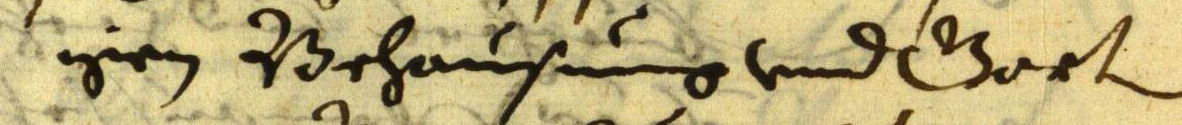igen Behaūsūng vnd Gart
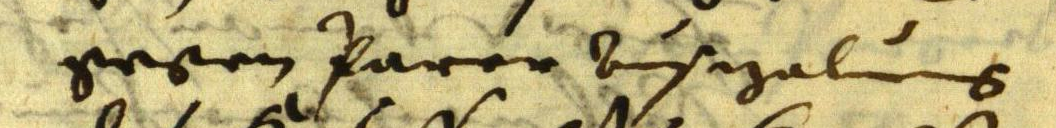gegen Parer Aūszalūng
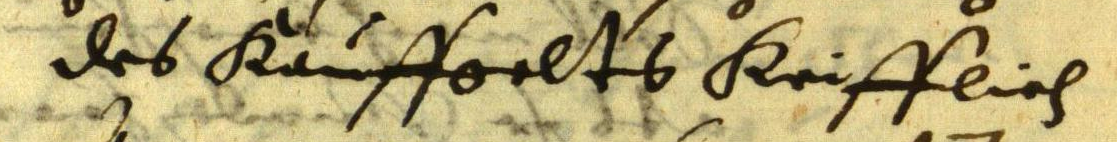des Kaūffgelts Keifflich
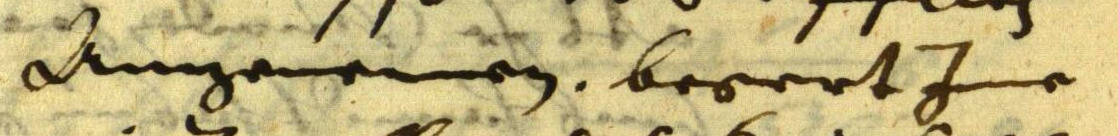Anzenemen. begert Ime
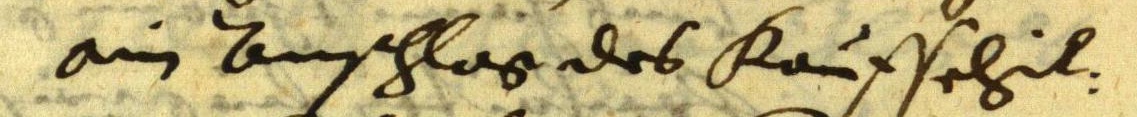ain Anschlag des Kaūfsschil¬
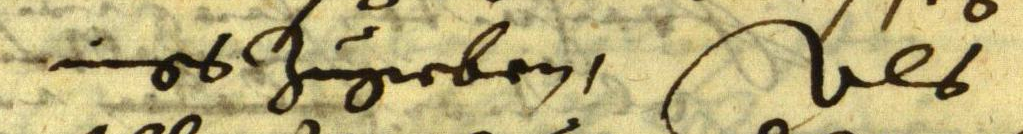ings Zūgeben, Als
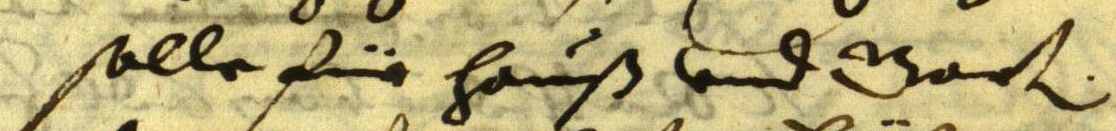solle für haūß vnd Gart.
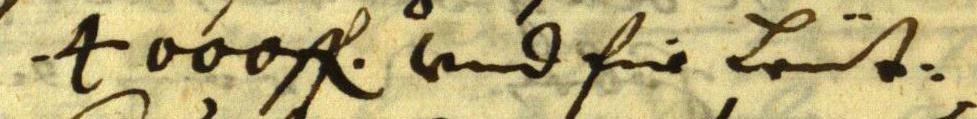.4000 fl. vnd fir Leüt¬
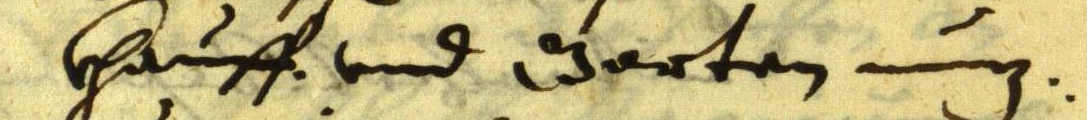khaūff vnd Garten nūz¬
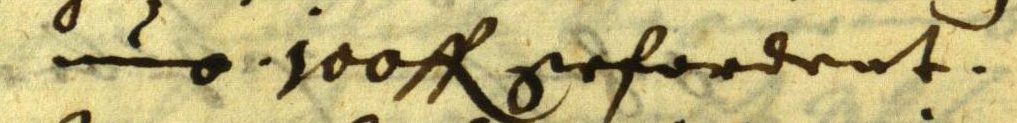ūng. 100 fl gefordert.
